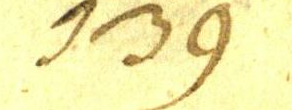139
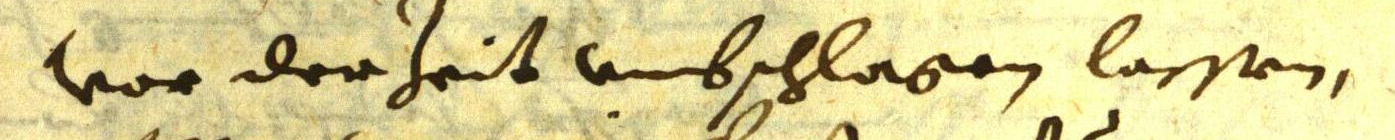vor der Zeit vmbschlagen lassen,
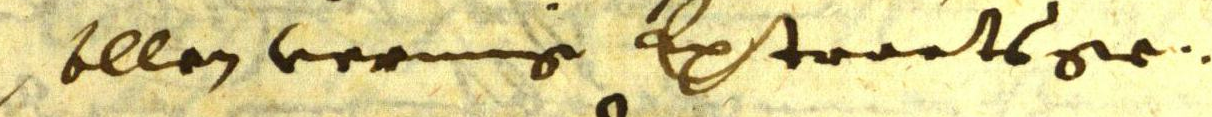sollen vermig Extracts ge¬
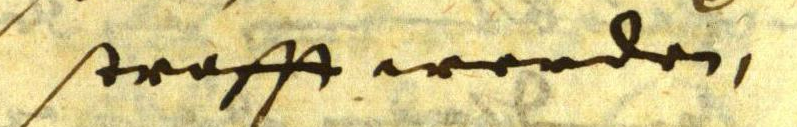strafft werden,
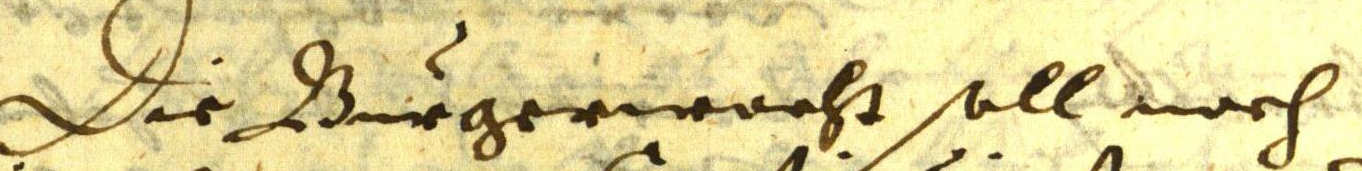Die Būrgerwacht soll noch
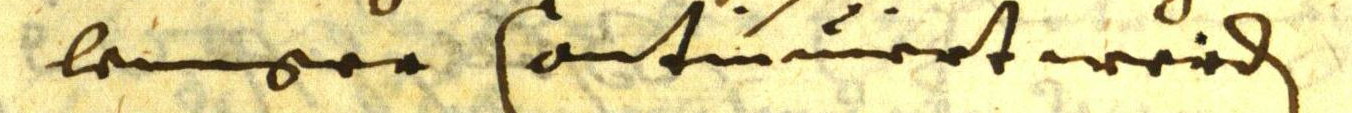lennger Continūiert werd.
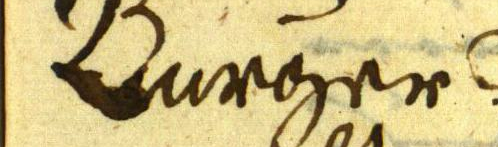Būrger¬
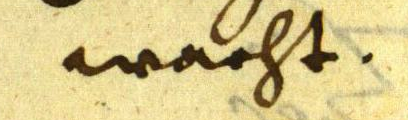wacht.
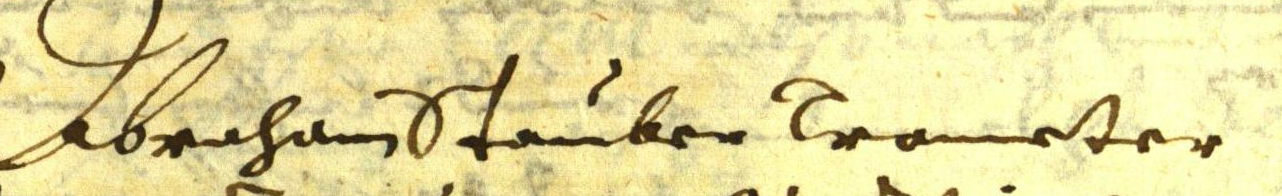Abraham Staūber Trometer
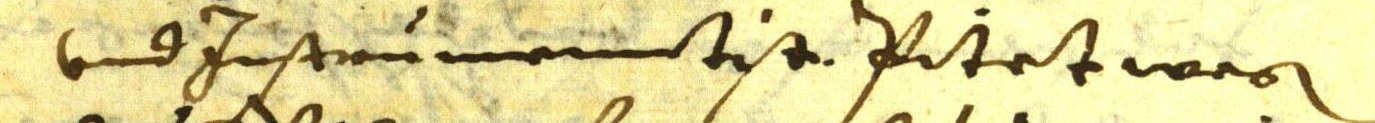vnd Instrūmentist. Pitet weg
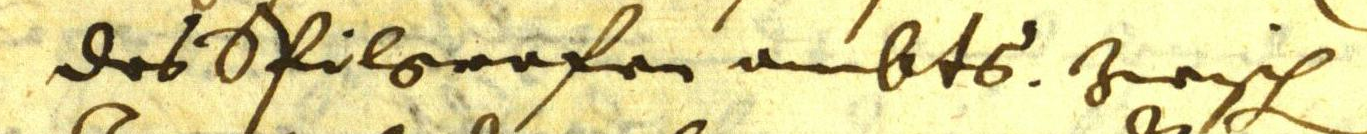des Spilgrafen ambts. Zwisch
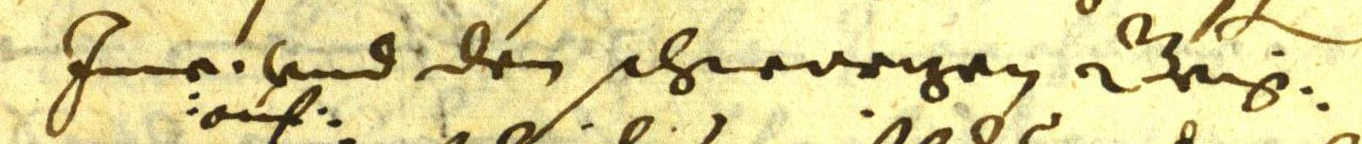Ime. vnd den schwarzen Geig¬
